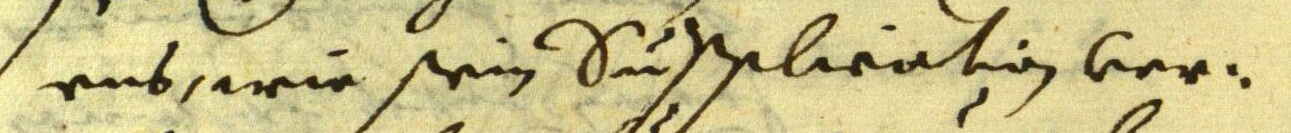ens, wie sein SūPplication ver¬
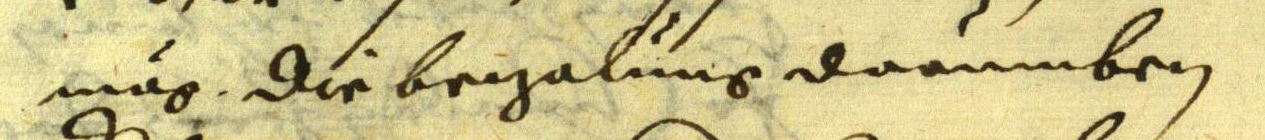māg. Die bezalūng darūmben
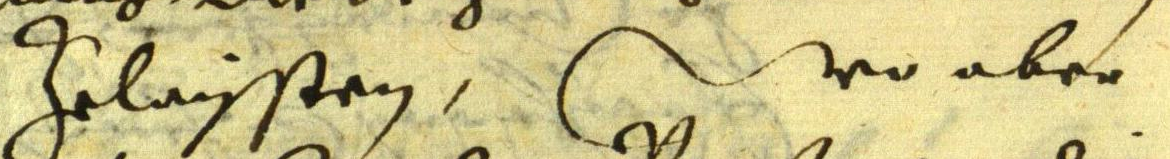Zelaissten, Wo aber
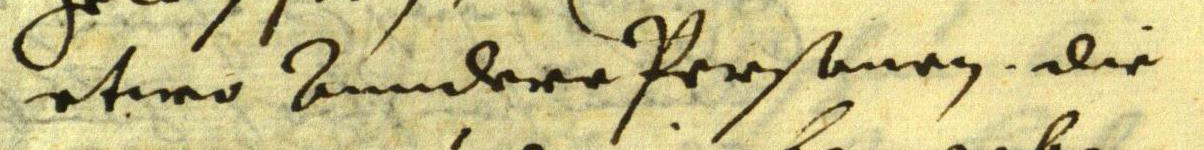etwa Anndere Personen. die
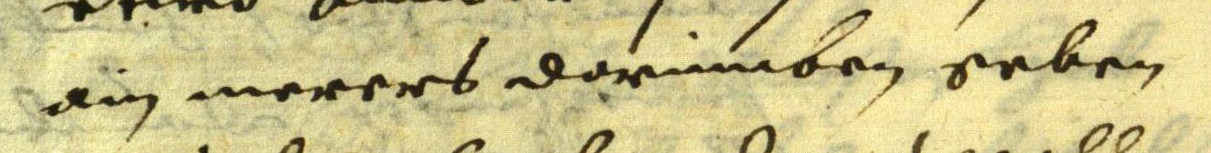ain merers darūmben geben
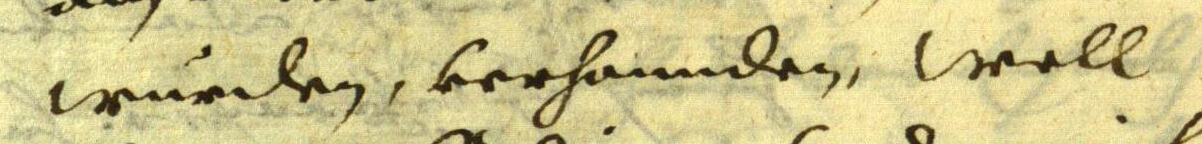wūrden, verhannden, well
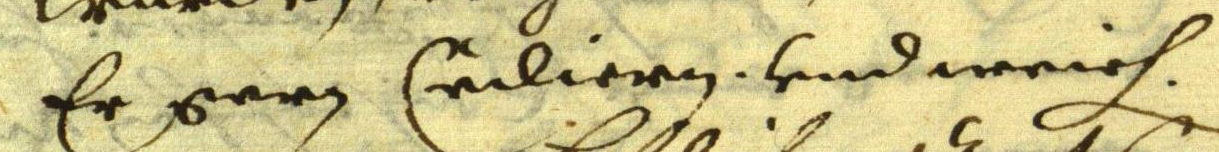Er gern Cediern. vnd weich
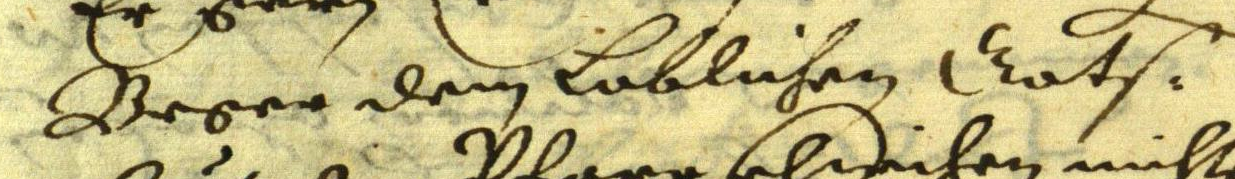Beger dem Loblichen Gots¬
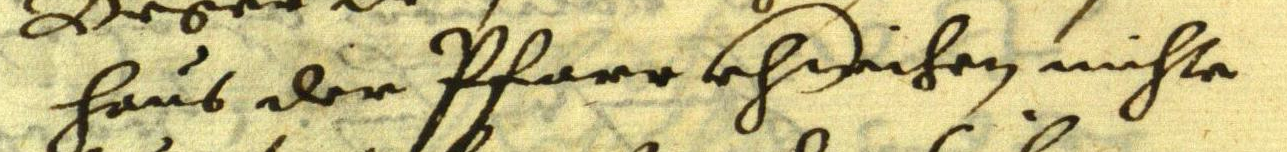haūs der Pfarr khirchen nichte
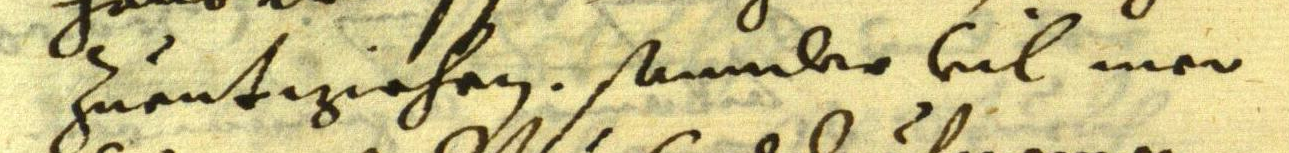Zūentziehen. sonnder vil mer
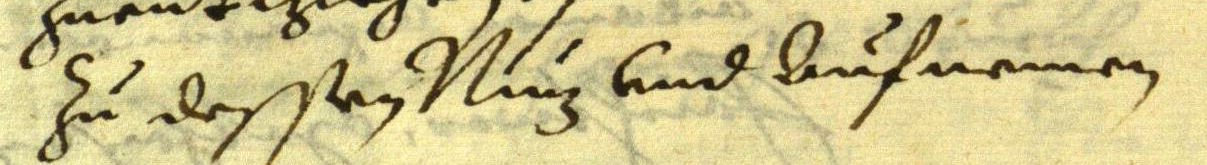Zū dessen Nūz vnd Aūfnemen
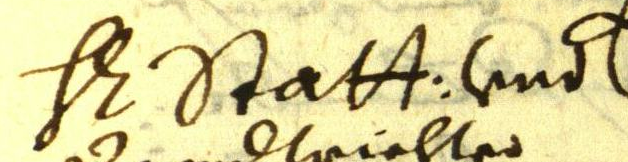Hl Statt: vnd
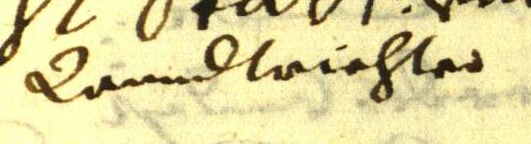Lanndtrichter.
